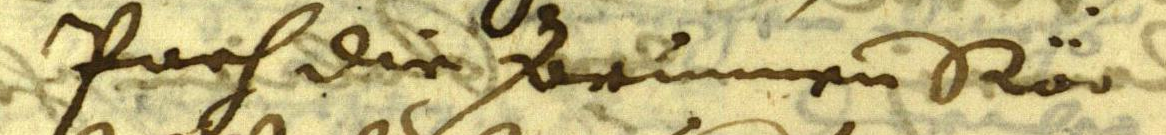Pach die Prūnnen Rör
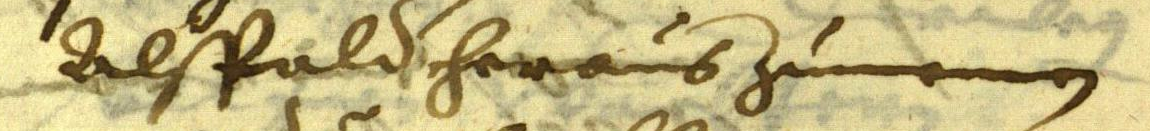Alspald heraūs Zūnemen
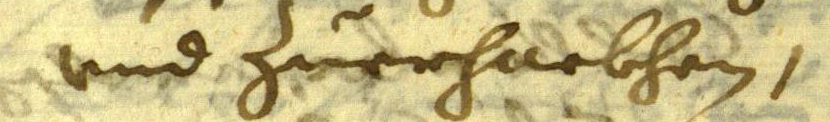vnd Zūerhackhen,
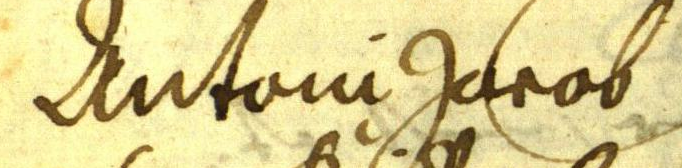Antoni Jacob
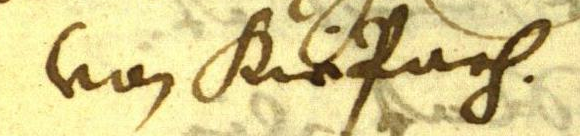von KiePach.
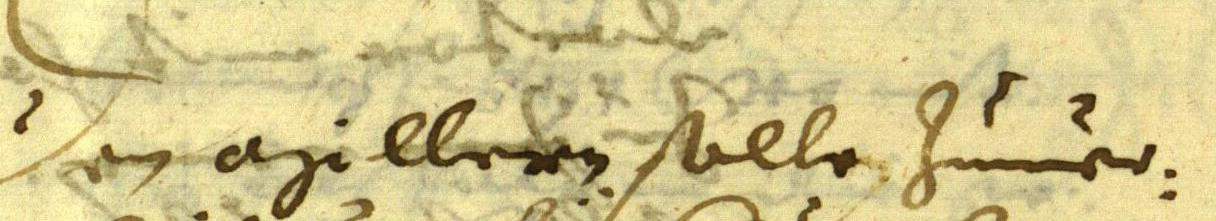Den Millern solle Zūūer¬
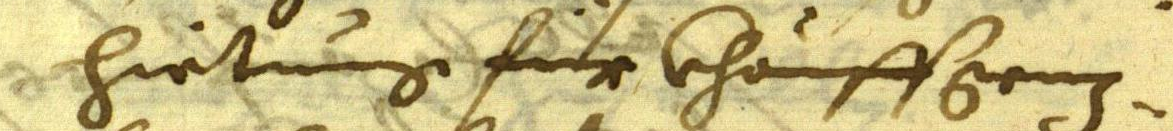hietūng für khaūff genz¬
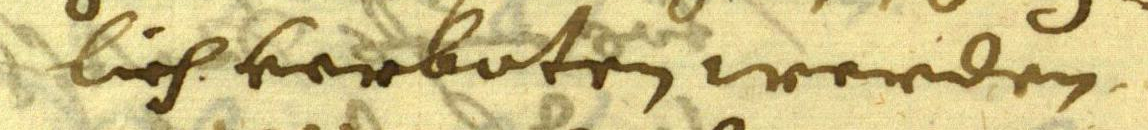lich verboten werden
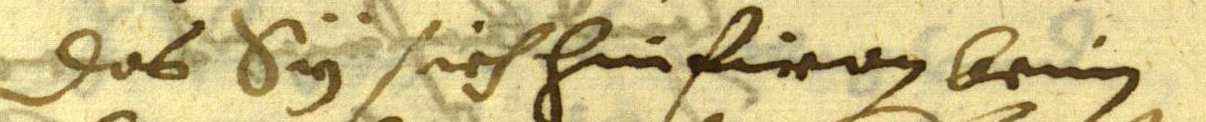das Sÿ sich hinfiern beim
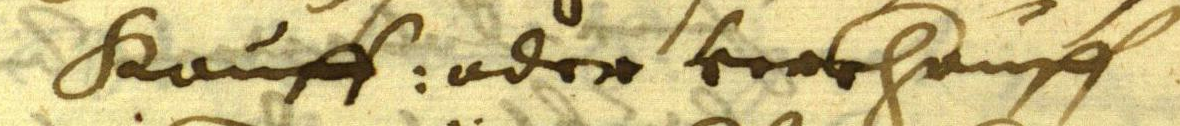Kaūff: oder verkhaūff
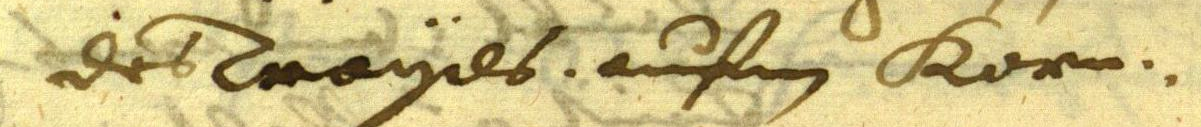des Traÿds. aūfm Korn¬
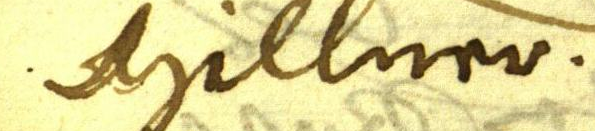Millner.
